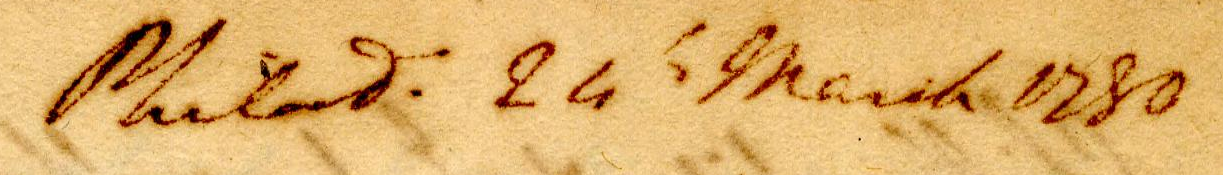Philad^a: 24^th March 1780
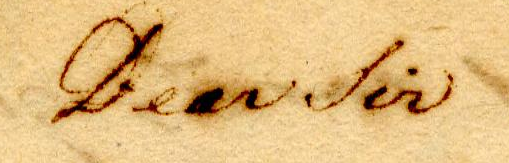Dear Sir
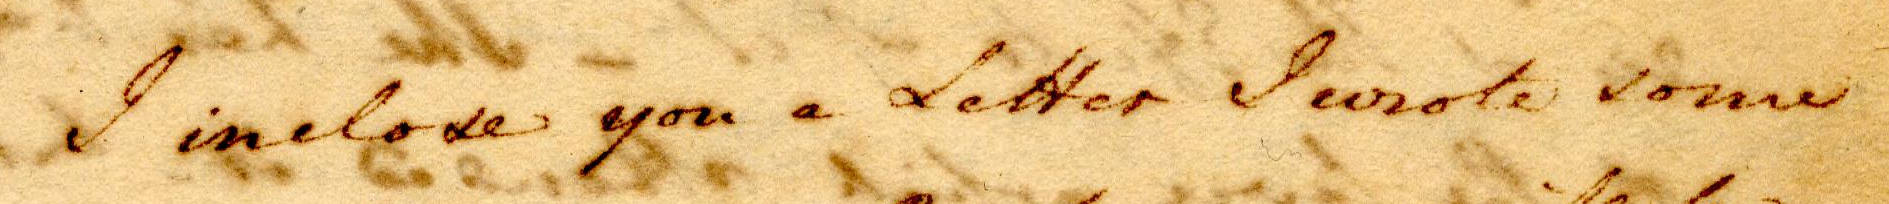I inclose you a Letter I wrote some
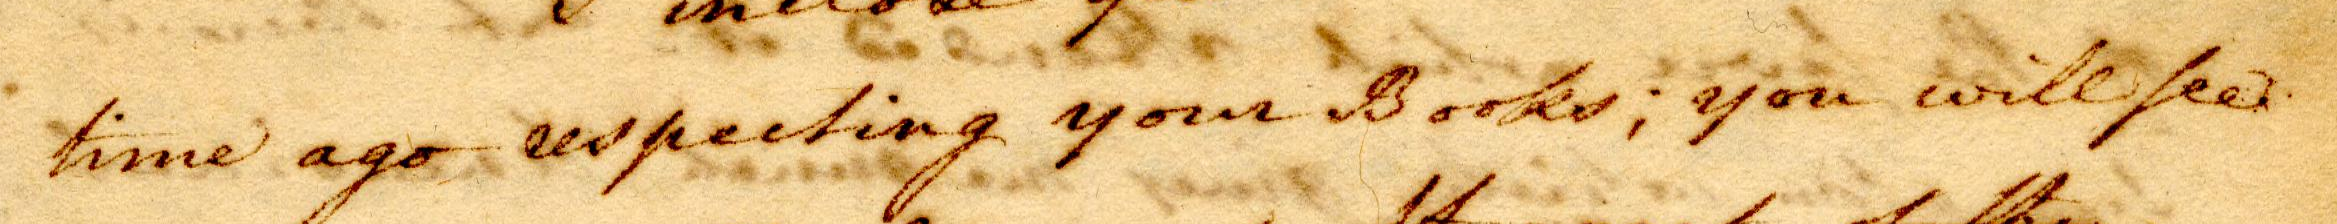time ago respecting your Books; you will see
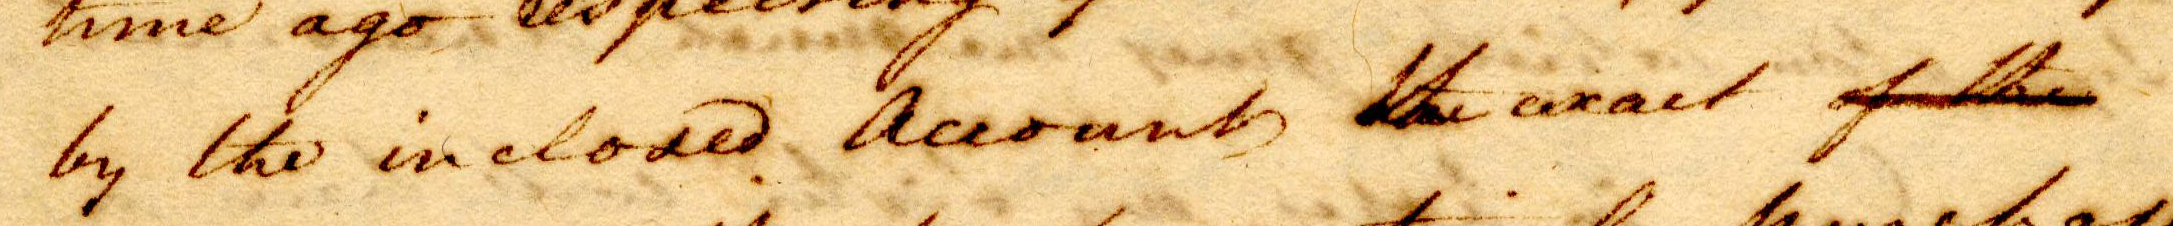by the inclosed Account the exact of the
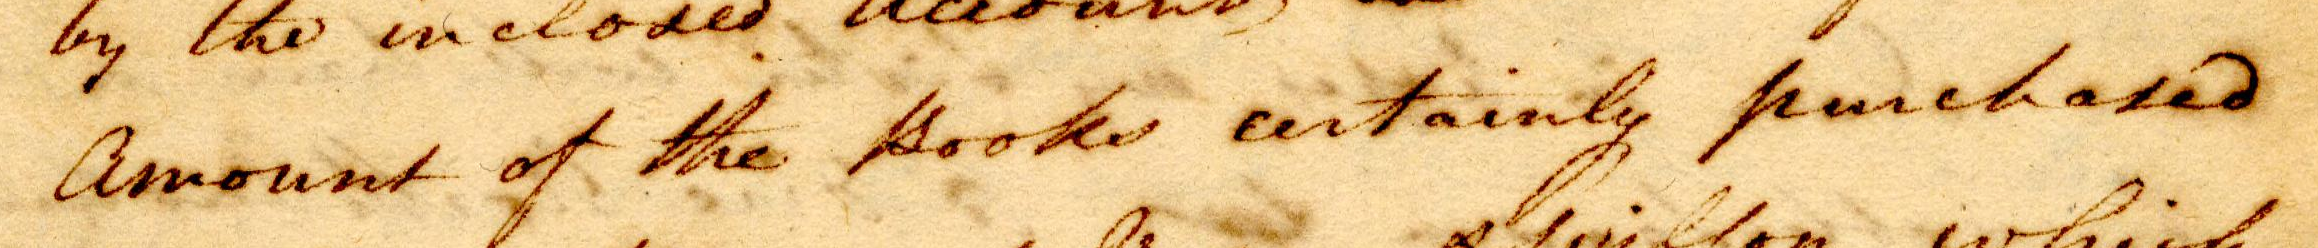Amount of the Books certainly purchased
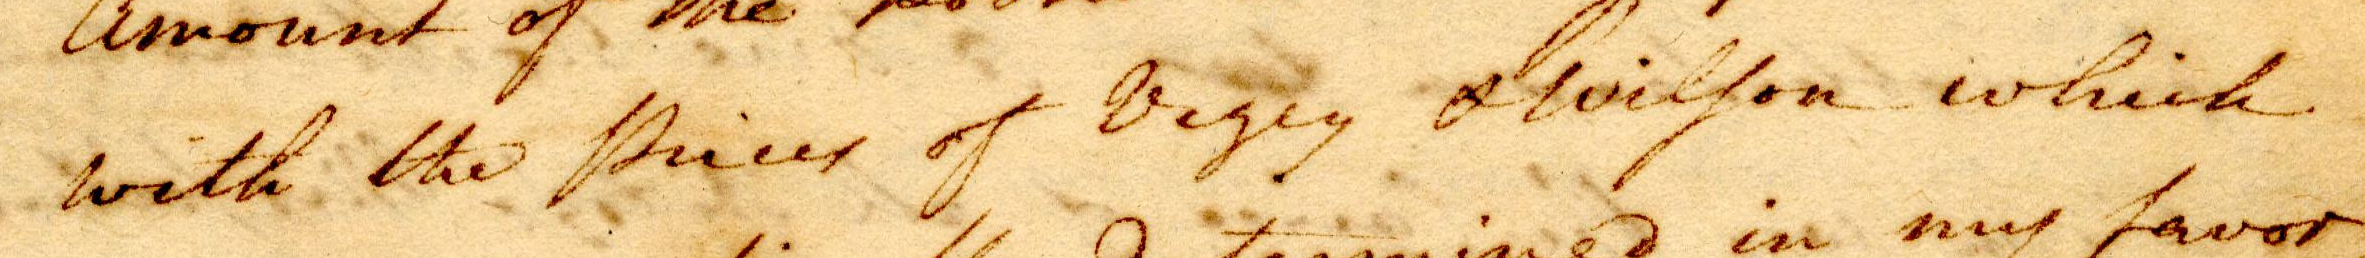with the Prices of Vegey & Wilson which
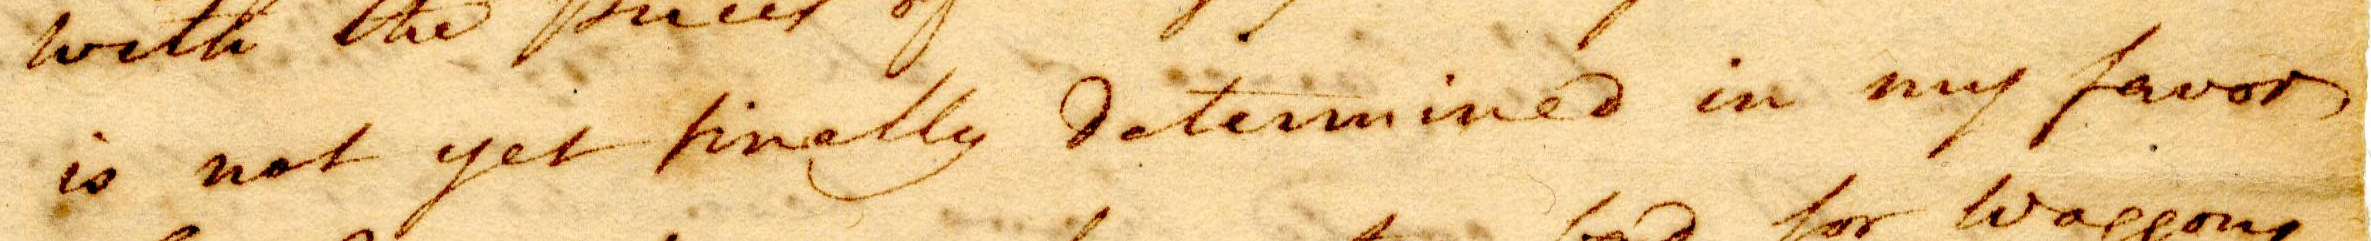is not yet finally determined in my favor
